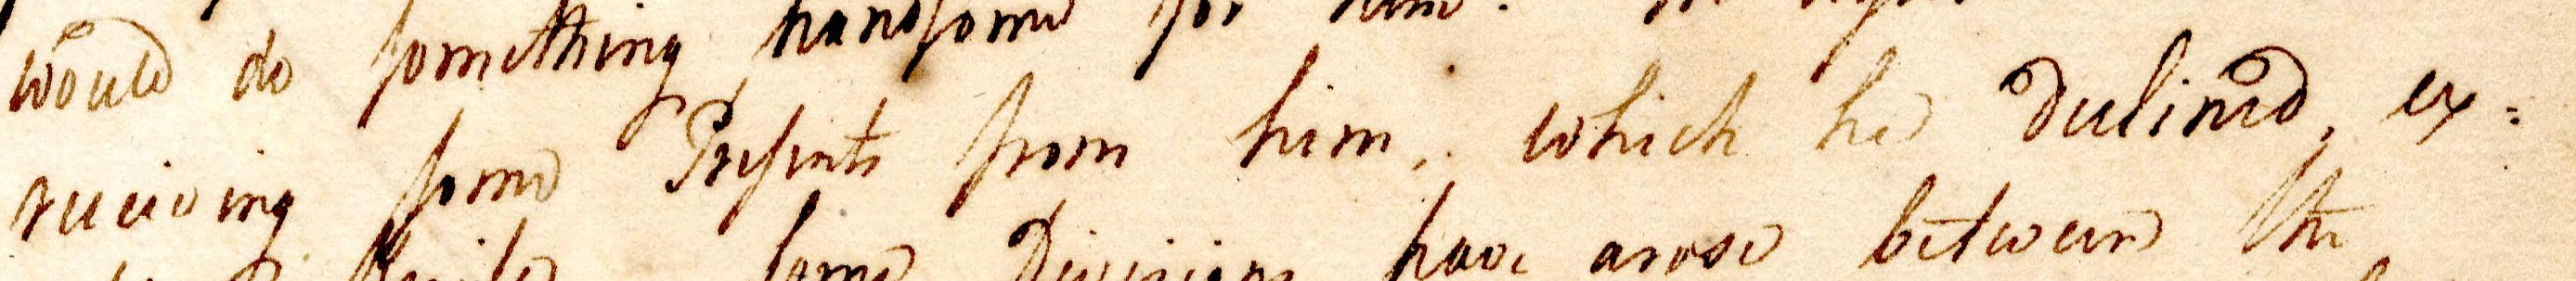receiving some Presents from him, which he declined, ex-
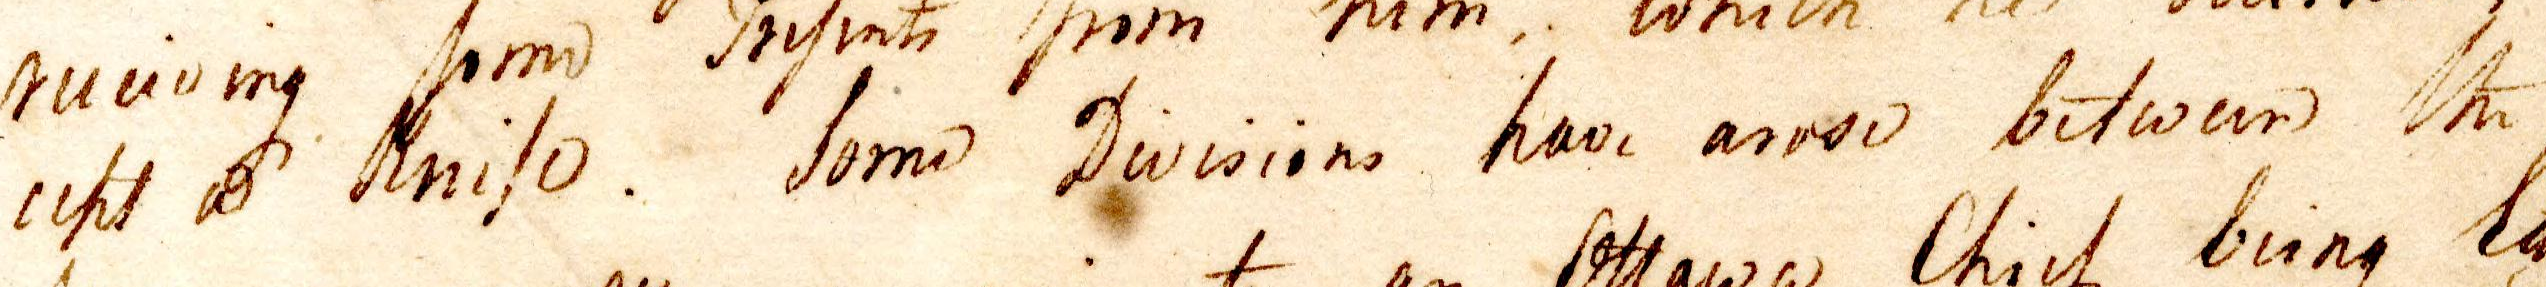cept a Knife. Some Divisions have arose between the
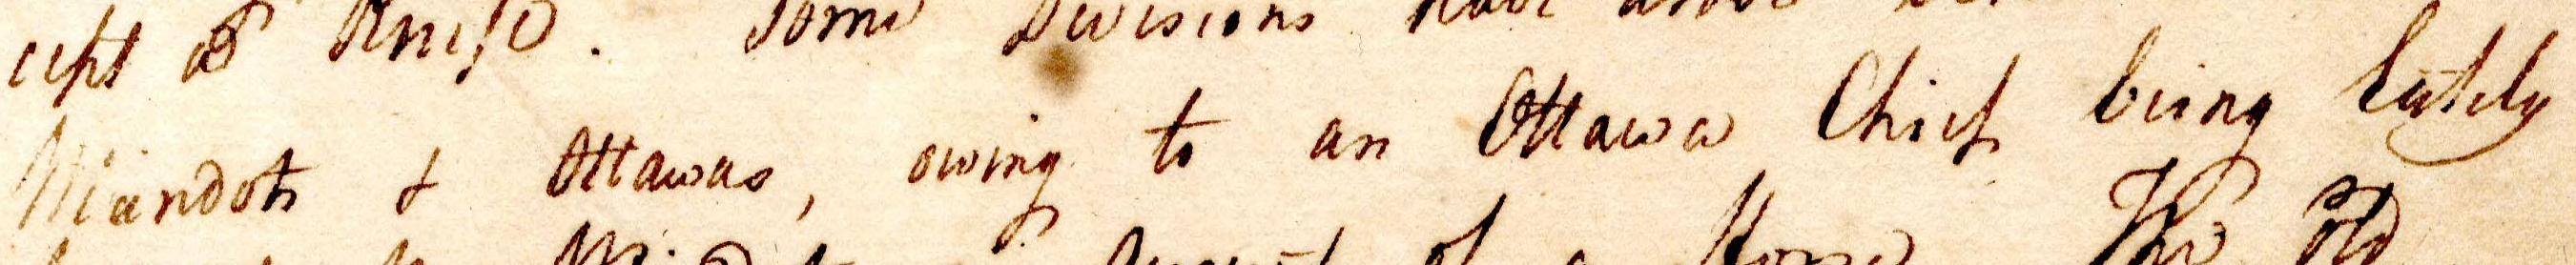Wiandots & Ottawas, owing to an Ottawa Chief being lately
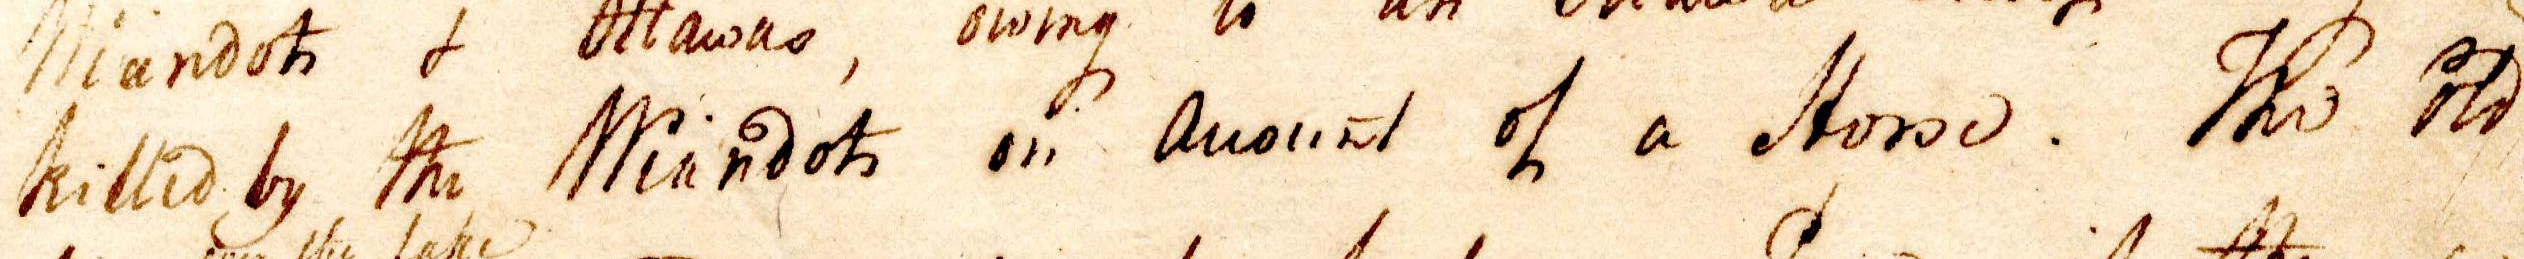killed by the Wiandots on account of a Horse. The old
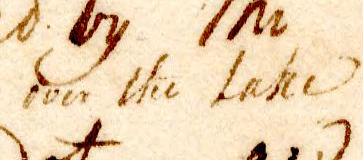over the Lake
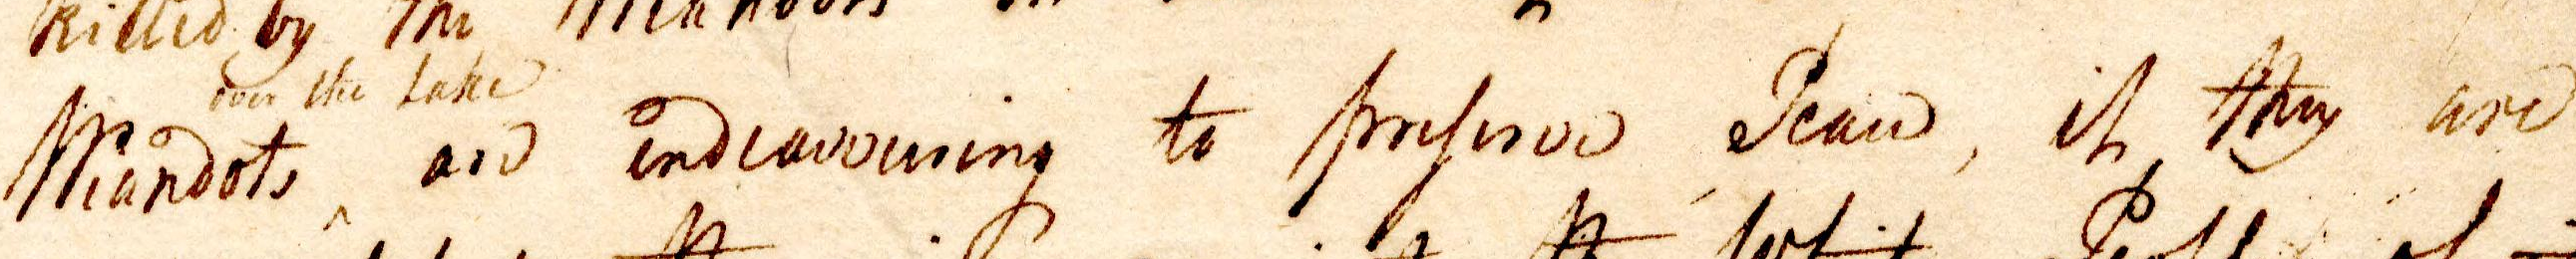Wiandots ^ are endeavouring to preserve Peace, if they are
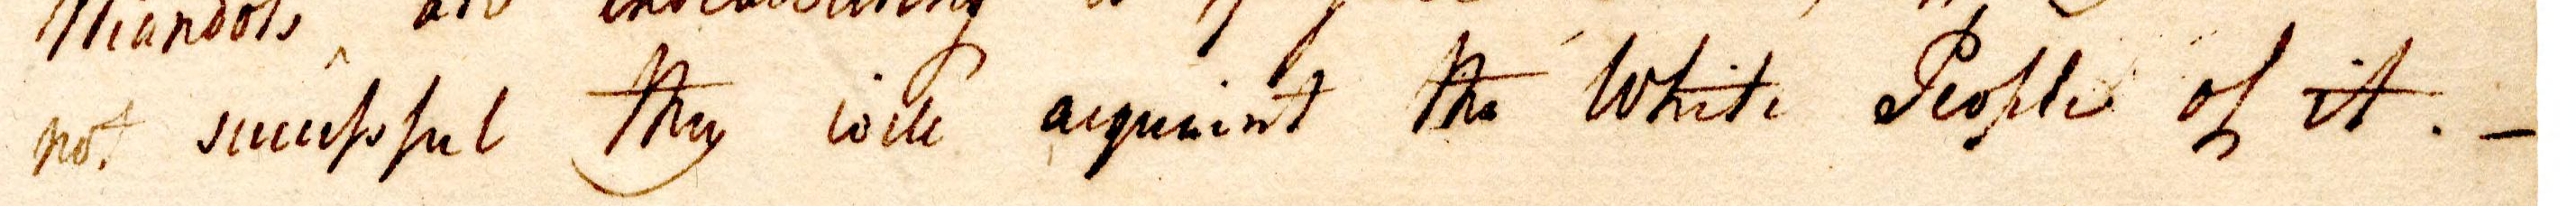not successful they will acquaint the White People of it.-
